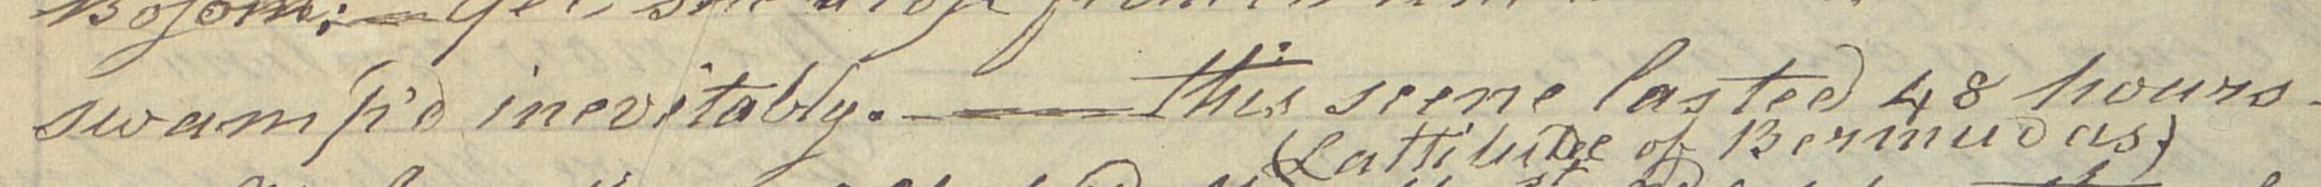swamp'd inevitably. this scene lasted 48 hours
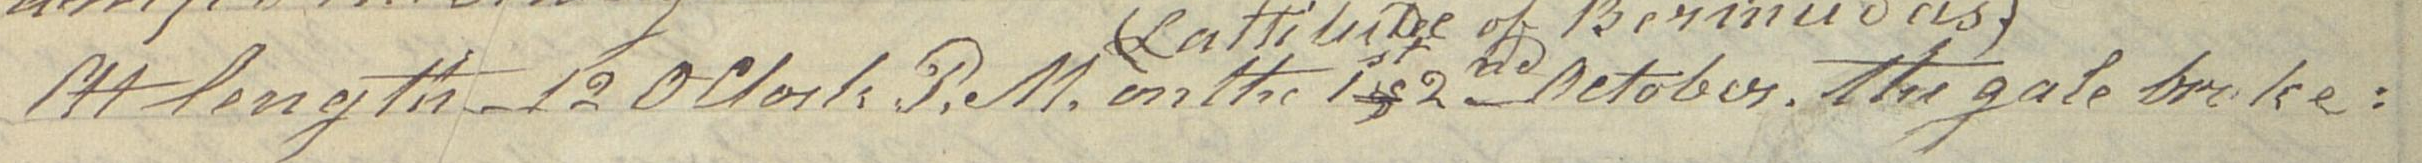At length 12 O Clock P.M. on the 1^st & 2^nd October, the gale broke:
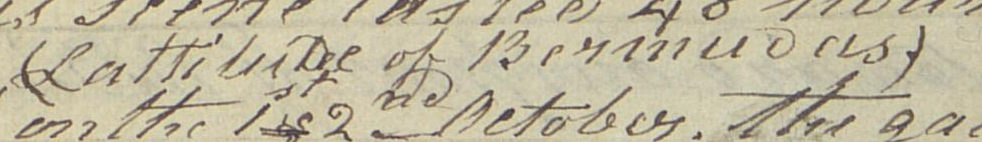Lattitude of Bermudas)
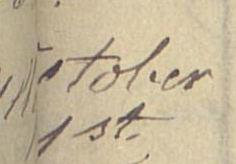-ctober
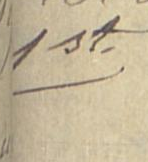1^st
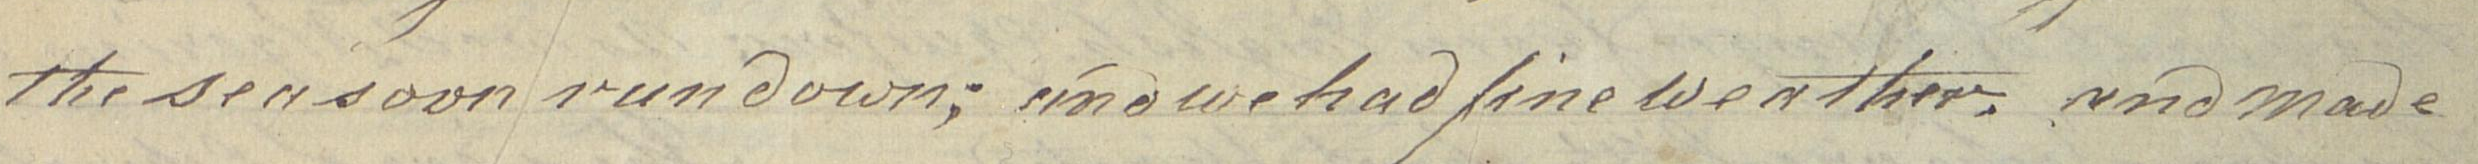the sea soon rundown; and we had fine weather and made
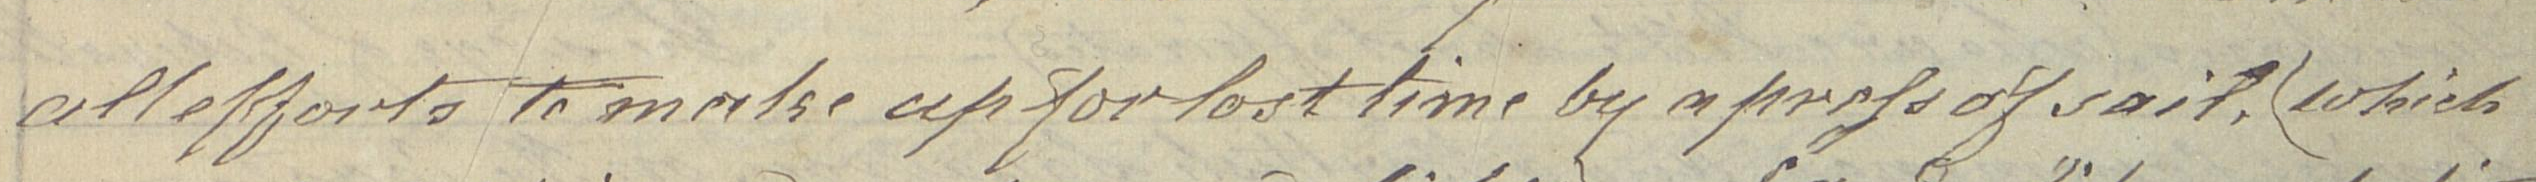all efforts to make up for lost time by a press of sail. (which
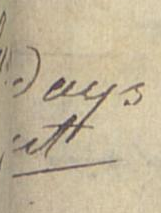-ays
